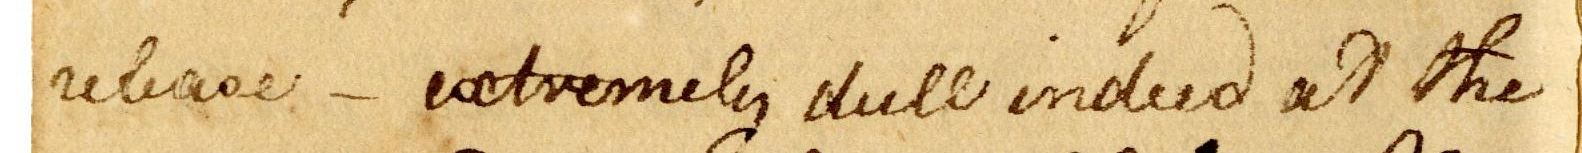release- extremely dull indeed at the
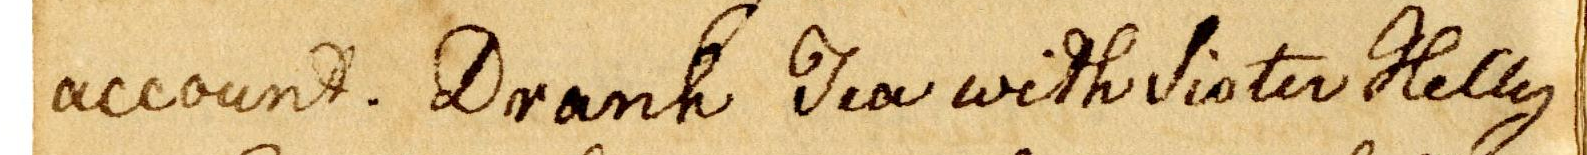account. Drank Tea with Sister Hetty
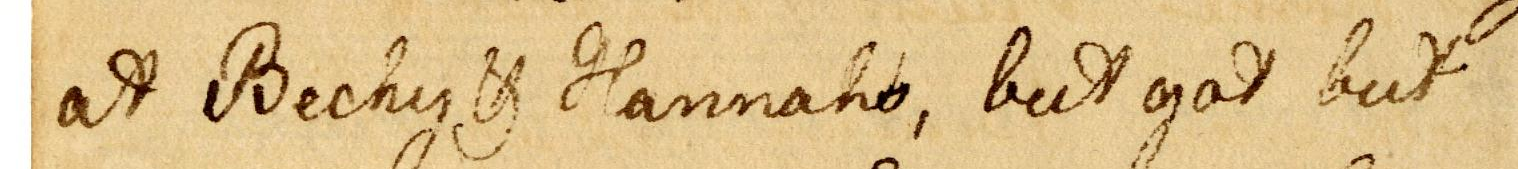at Becky & Hannahs, but got but
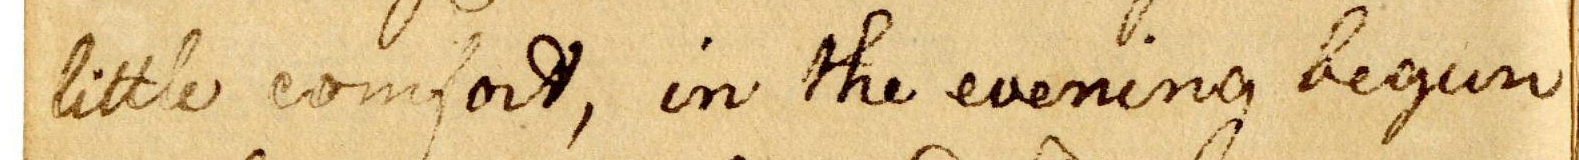little comfort, in the evening begun
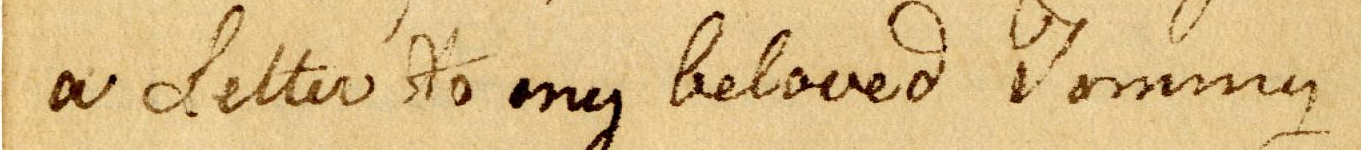a Letter to my beloved Tommy
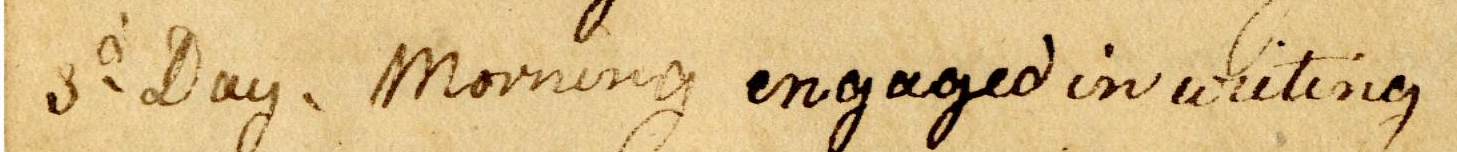3^d. Day. Morning engaged in writing
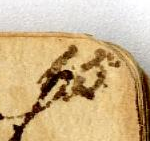15
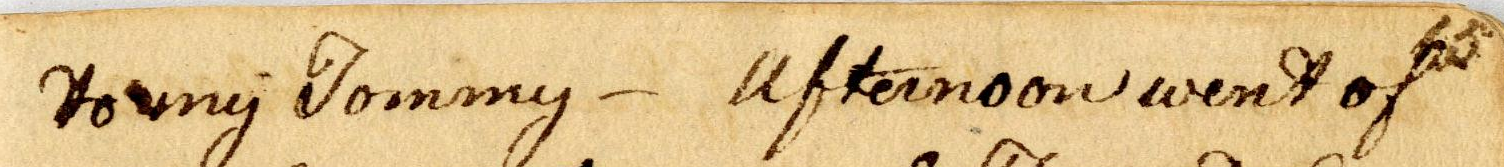to my Tommy- Afternoon went of
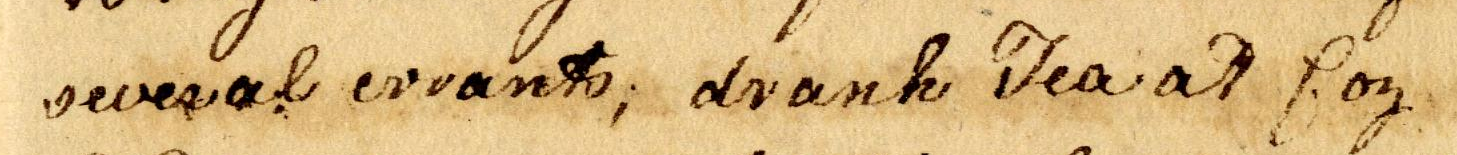several errants, drank Tea at Coz
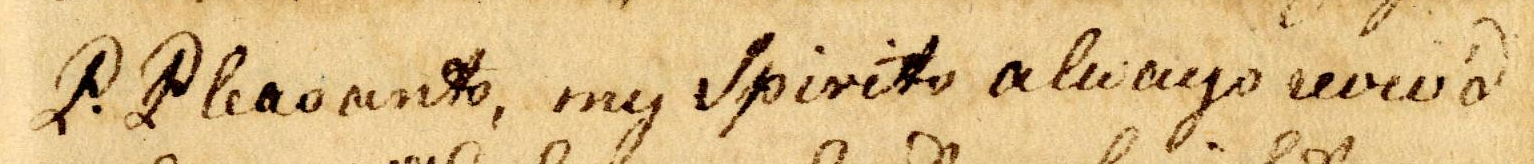P. Pleasants, my Spirits always reviv'd
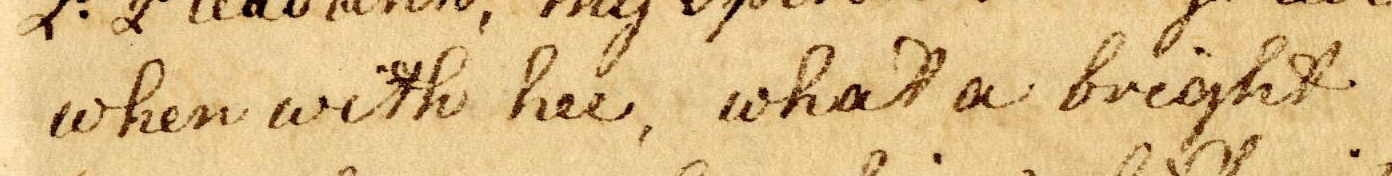when with her, what a bright
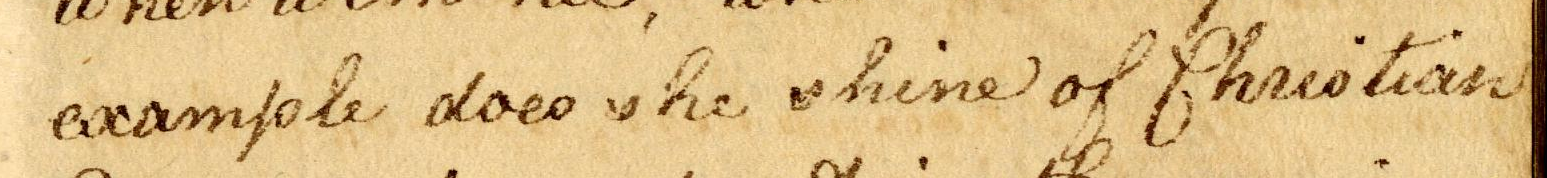example does she shine of Christian
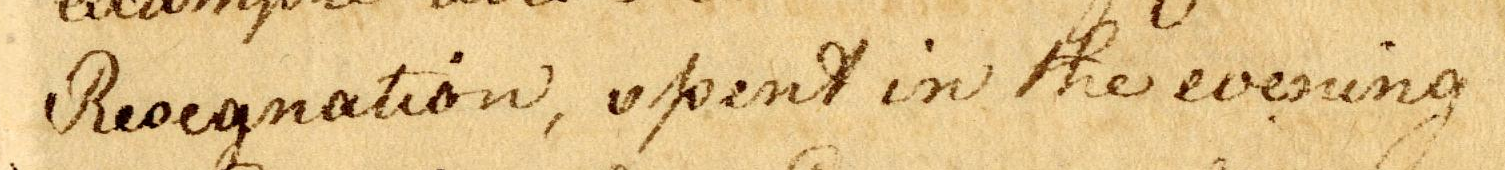Resegnation, spent in the evening
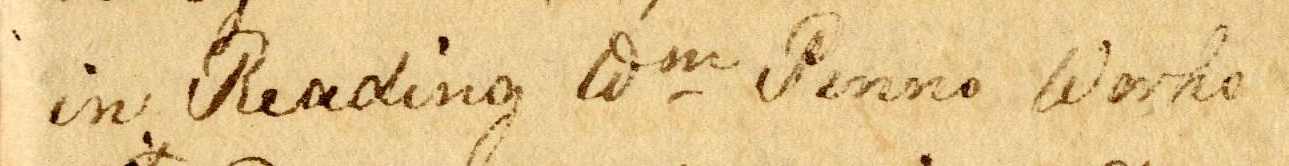in Reading W^m Penns Works
